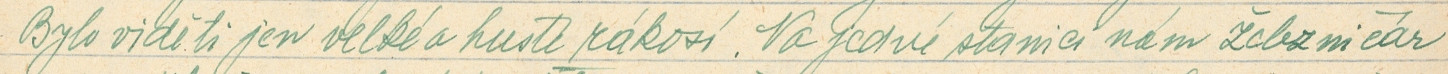Bylo viděti jen velké a husté rákosí. Na jedné stanici nám železničár
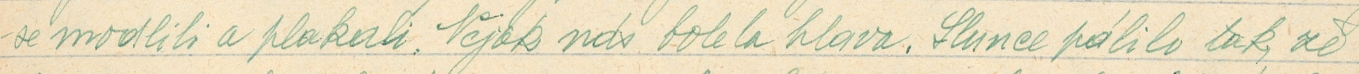se modlili a plakali. Nějak nás bolela hlava. Slunce pálilo tak, že
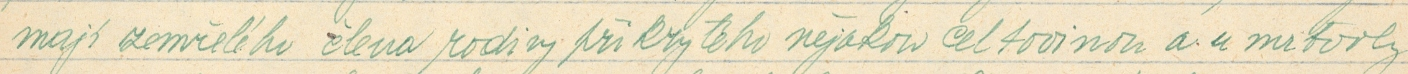mají zemřelého člena rodiny přikrytého nějakou celtovinou a u mrtvoly
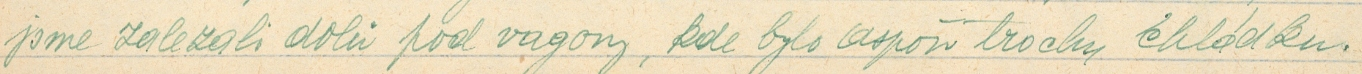jsme zalezali dolů pod vagony, kde bylo aspoň trochu chládku.
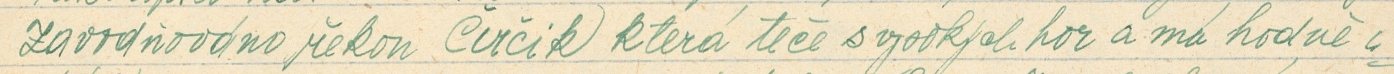zavodňováno řekou Čerčik která teče s vysokých hor a má hodně
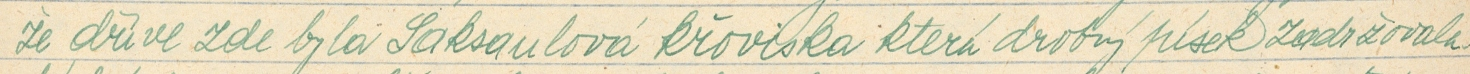že dříve zde byla Saksaulová křoviska která drobný písek zadržovala.
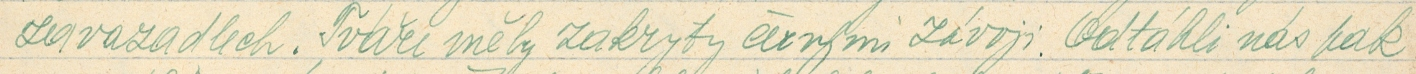zavazadlech. Tváře měly zakryty černými závoji. Odtáhli nás pak
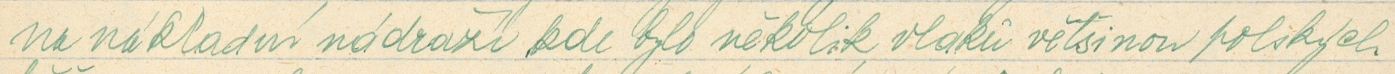na nákladní nádraží kde bylo několik vlaků většinou polských
